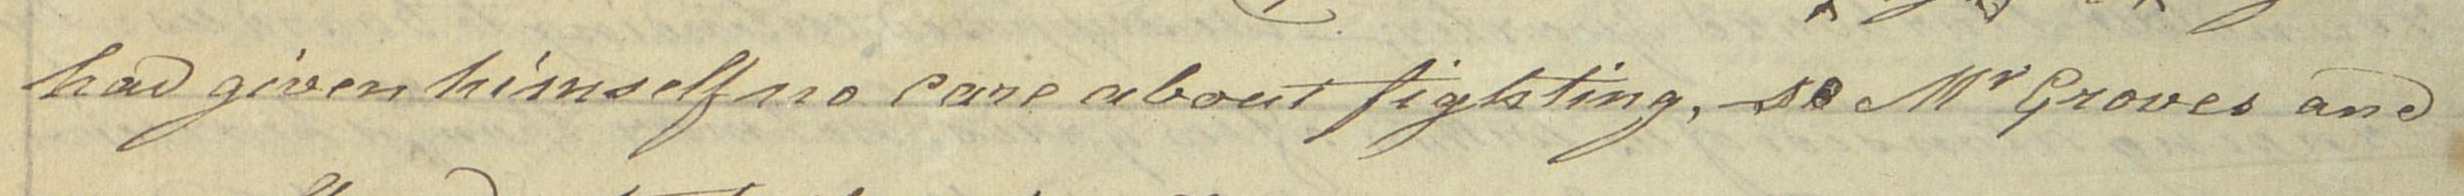had given himself no care about fighting, so M^r Groves and
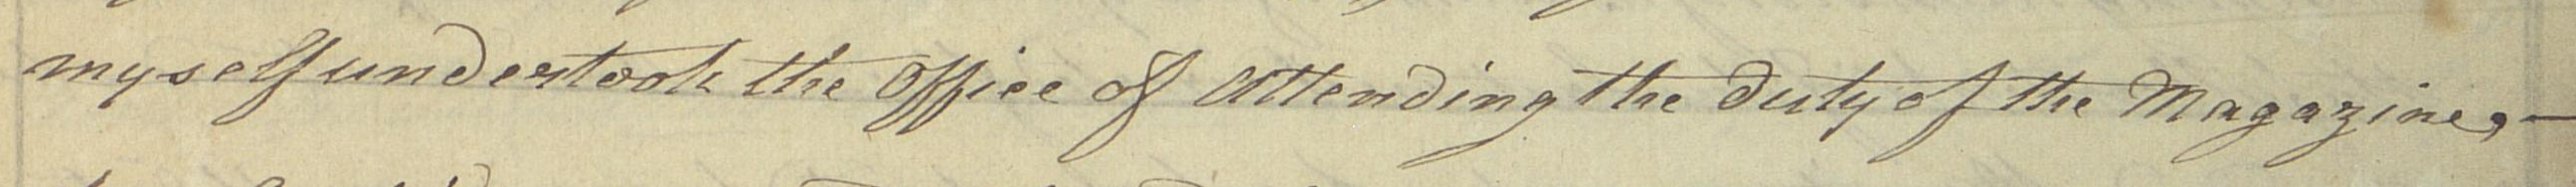myself undertook the Office of Attending the duty of the Magazine,
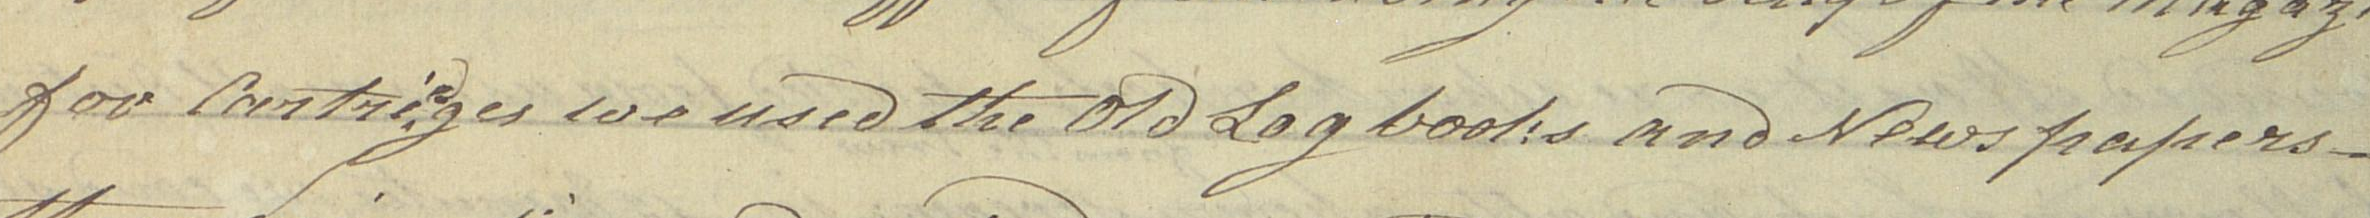for Cartidges we used the Old Logbooks and Newspapers
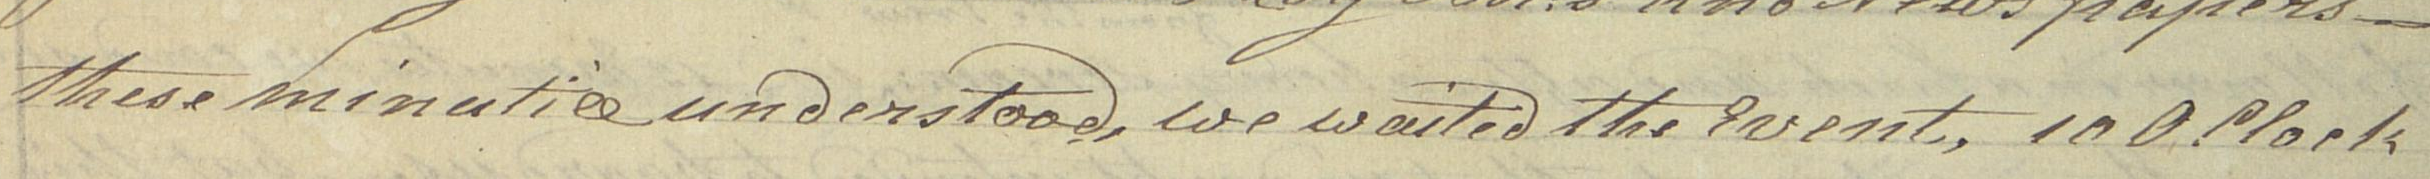These minutiae understood, we waited the Event, 10 O Clock
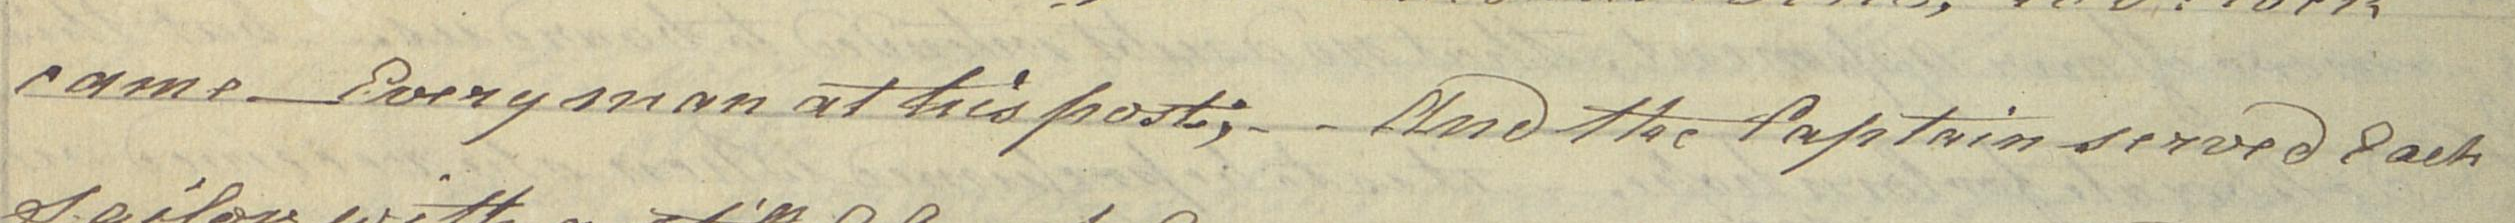came- Every man at his port; And the Captain served Each
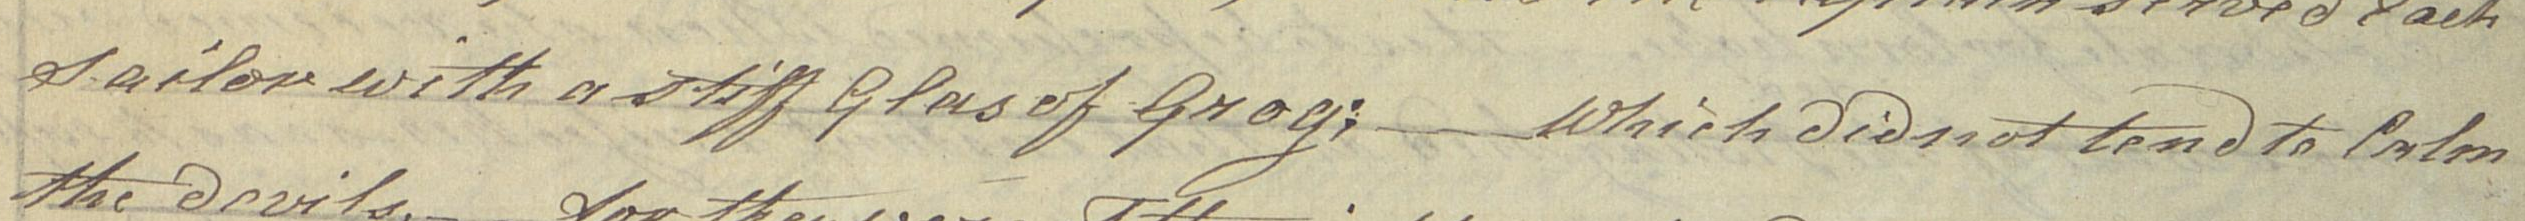Sailor with a stiff Glas of Grog: Which did not tend to Calm
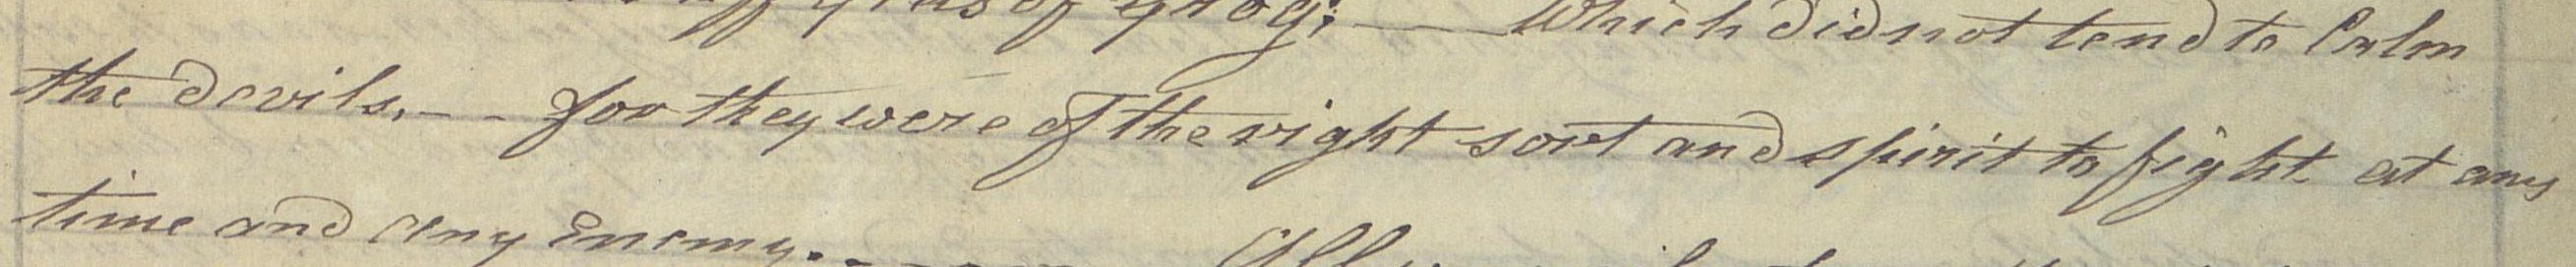the devils, for they were of the right sort and spirit to fight at any
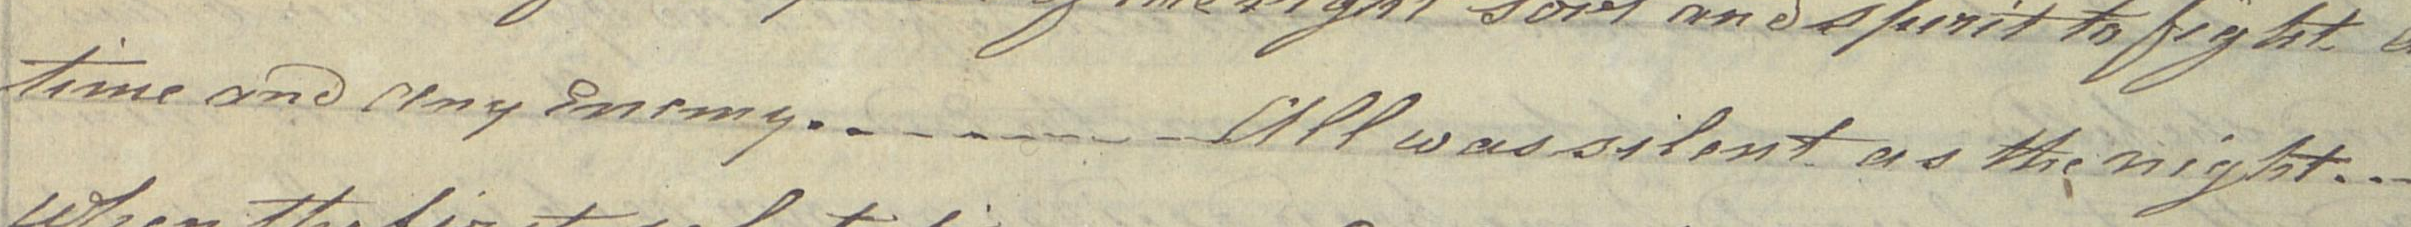time and any Enemy. All was silent as the night.
